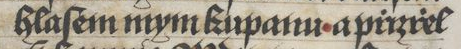hlaſem mym kupanu.a pṙizṙel
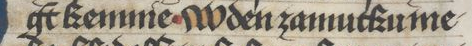ḡt kemnie.Wden zamutku me¬
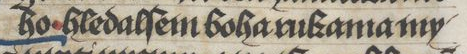ho.hledalſem boha rukama my¬
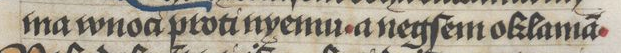ma wnoci proti nyemu.a negſem oklamā.
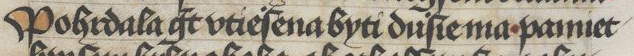Pohrdala ḡt utieẛena byti duẛie ma.pamiet¬
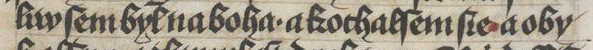liw ſem byl na boha.a kochalſem ſie.a oby¬
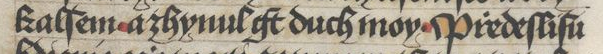kalſem.a zhynul ḡt duch moy.Pṙedeſliſu
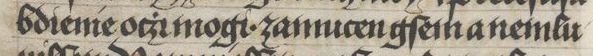bdienie ocżi mogi.zamucen gſem a nemlu¬
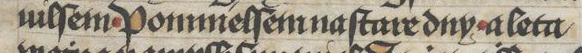uilſem.Pomnielſem naſtare dny.a leta
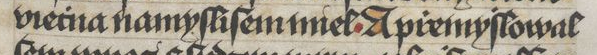vieċna namyſliſem miel.A pṙemyẛlowal
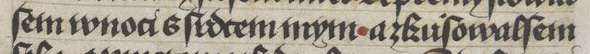ſem wnoci sſrdcem mym.a zkuẛowalſem
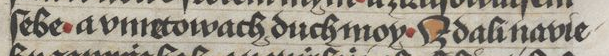ſebe.a vmrtowach duch moy.Zdali navie
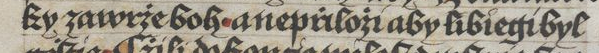ky zawrže boh.a nepṙilożí aby libiegí byl
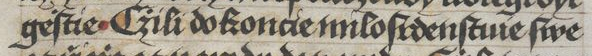geẛtie.Cżili do koncie miloſrdenſtuie ſwe
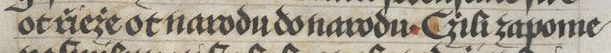otṙieże ot narodu do narodu.Cżili zapome¬
